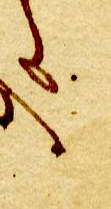To
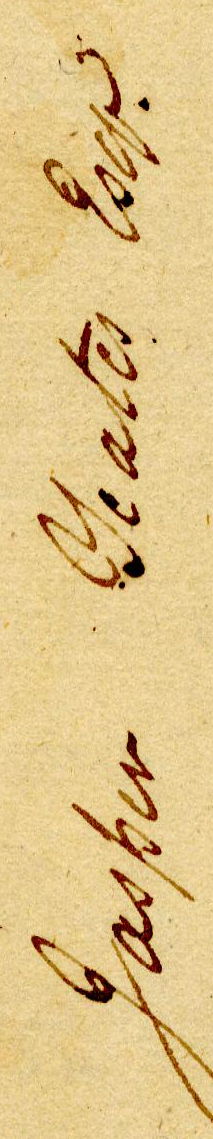Jasper Yeates Esq^r.
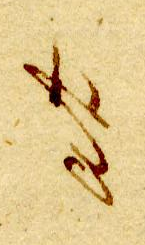at
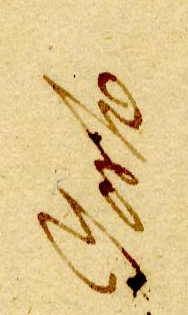York
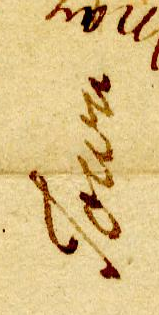Town
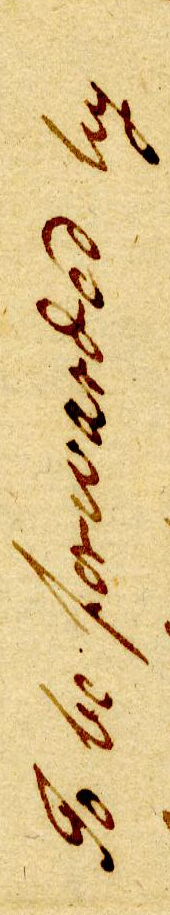To be forwarded by
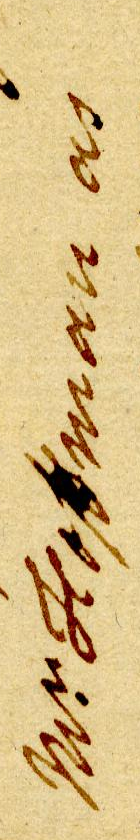M^r Hoffman as
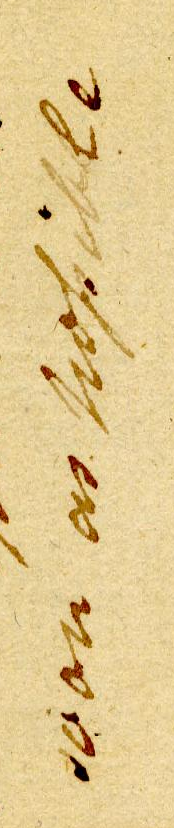soon as possible
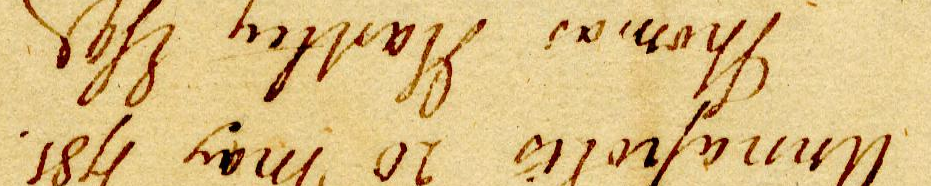Annapolis 20 May 1781.
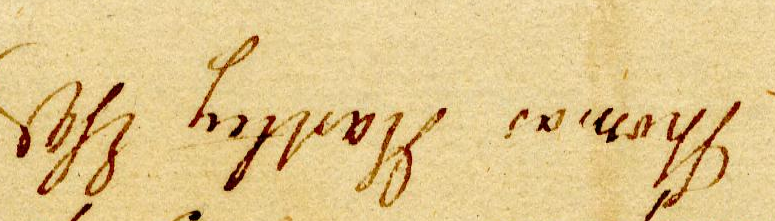Thomas Hartley Esq^r.
